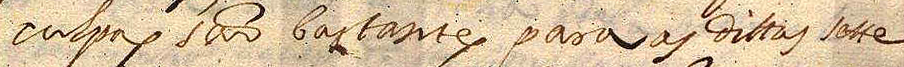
culpas saõ bastantes para as dittas sette
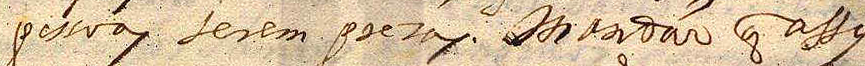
pessoas serem prezas. mandaõ q̄ assy
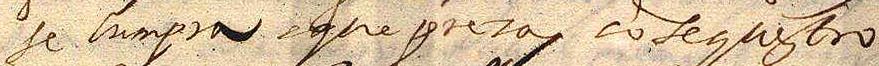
se cumpra E que prezas cō sequestro
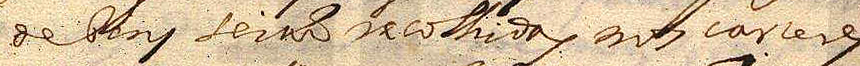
de bens seiaõ recolhidas nos carceres
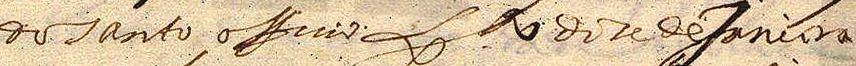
do santo officio Lx.a doze de Janeiro
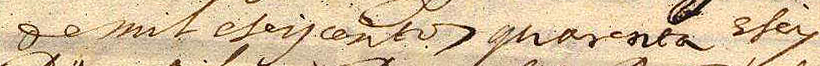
de miL e seiscentos quarenta E seis
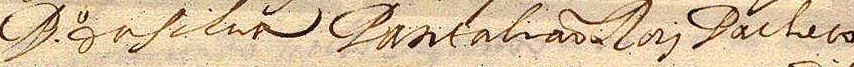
P.o da Silua Pantaliaõ Rois Pacheco
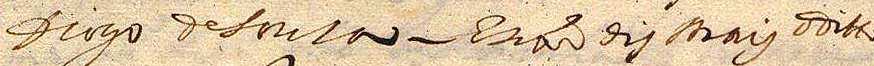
Diogo de souza - E naõ dis mais o ditto
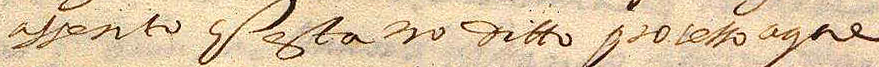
assento q̄ esta no ditto processo a que
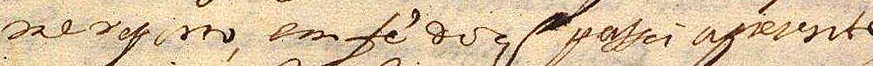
me reporto, em fé do q̄ passei a prezente
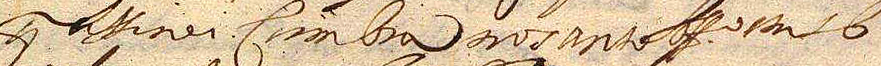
q̄ assinei Coimbra no santo off.o em 16
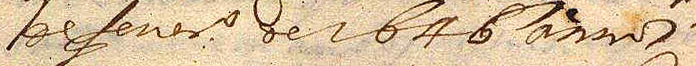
de feuer.o de 1646 annos
